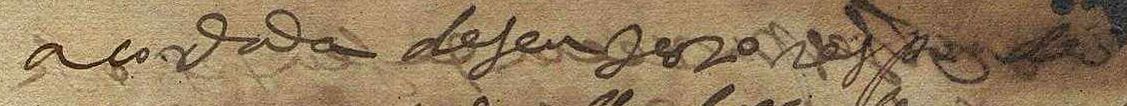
acordada de seu testo respondeo
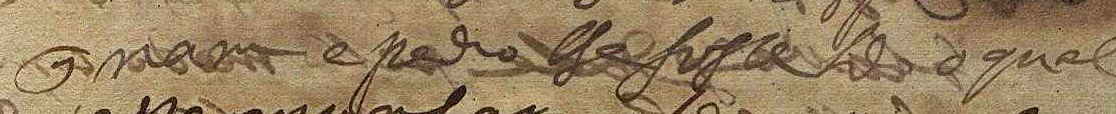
q̄ nam e pedio lhe fosse lido o qual
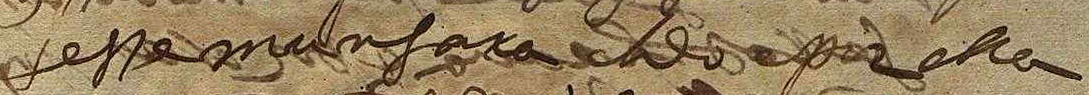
testemunhara lido e por ella
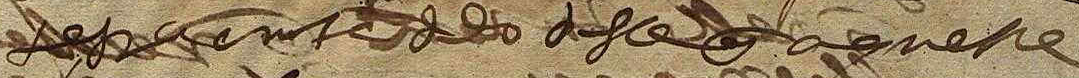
testa emtēdido disse q̄ aquelle
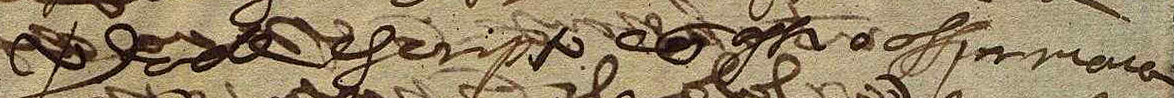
ꝟdade escripto e q̄ assi o affjrmaua
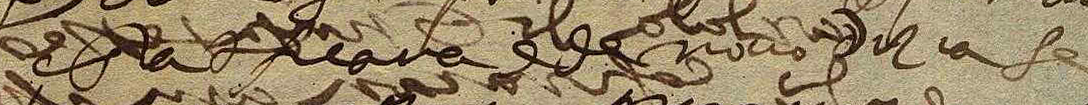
e Rateficaua e de nouo dizia se
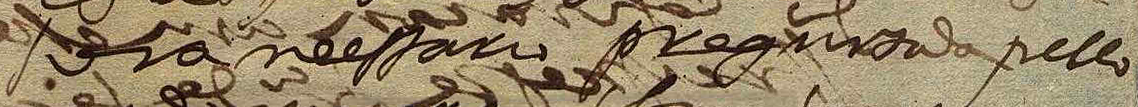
fora necessario preguntado pello
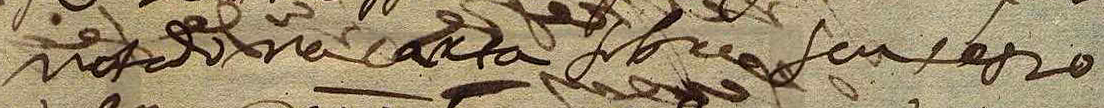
notado na carta sobre seu testo
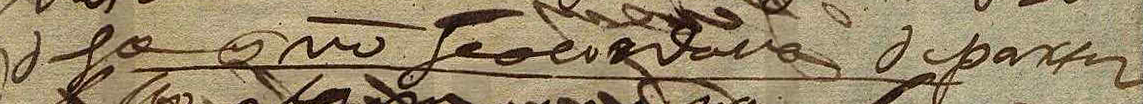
dise q̄ nō se acordaua de partir
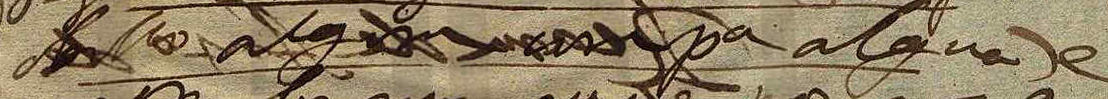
o bollo algum com pa alguā e
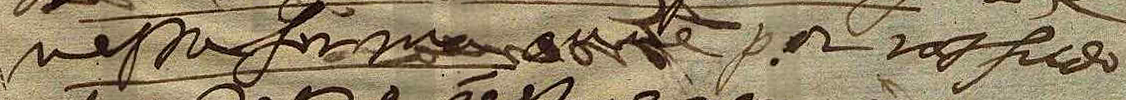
nesta forma ouue p.or ratficado
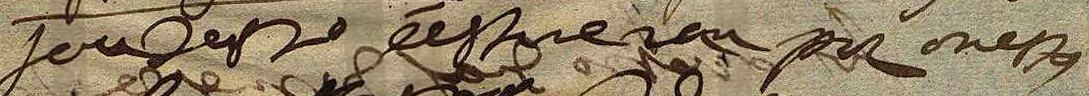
seu testo e estiueron por onestas
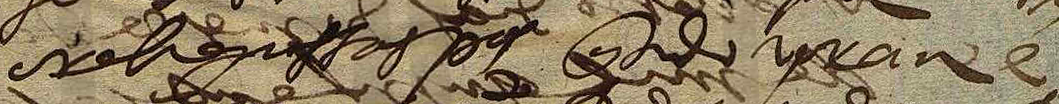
e religiosas pas q̄ tudo vjram e
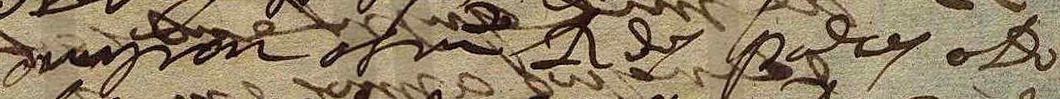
ouujron os mtoo Rdos padres o Dr
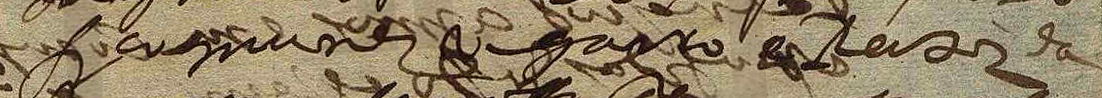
frco munez vigairo e Reitor da
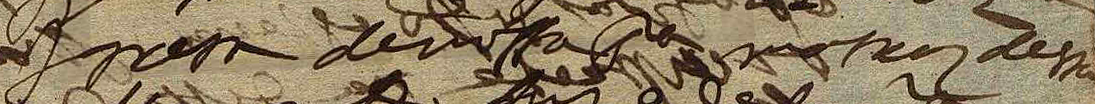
Jgreja de nossa sra matriz desta
